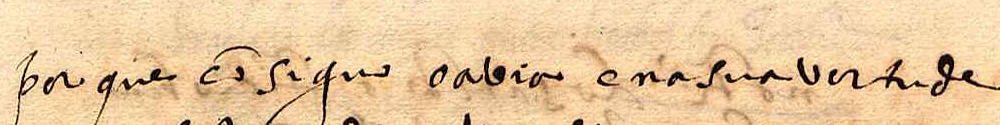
porque cōsiguo o avia e na sua vertude
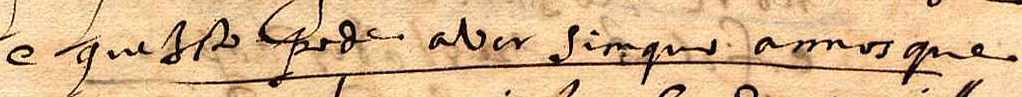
e que Isto pode aver simquo annos que
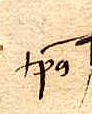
tp̄ꝯ
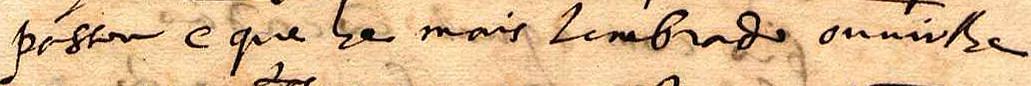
passou e que he mais lembrado ouuirlhe
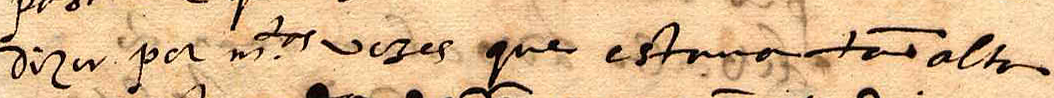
dizer por m.tas vezes que estaua tão alta
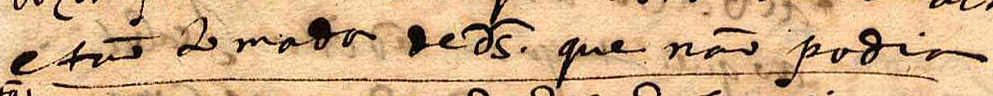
e tão tomada de ds̄ que não podia
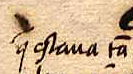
q̄ estaua tā
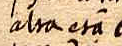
alta e tā
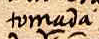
tomada
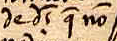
de ds̄ q̄ nō
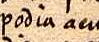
podia acu
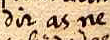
dir as ne
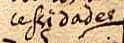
cessidades
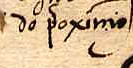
do p̄oximo
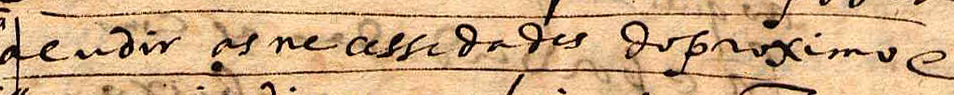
acudir as necessidades do proximo e
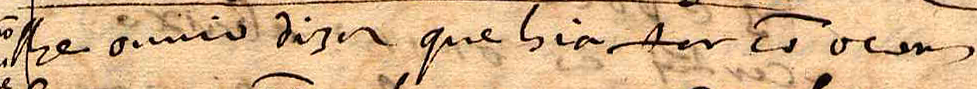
lhe ouuio dizer que hia ter cō o com
